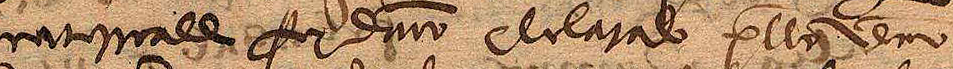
corte rreall foy dito e declarado p̄llo dito
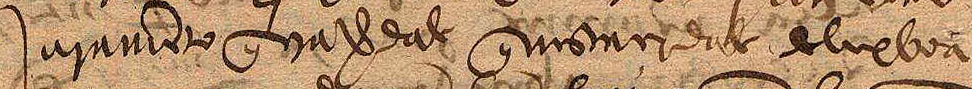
Juramēto q̄ era ꝟdade q̄ nesta çjdade de lixboa
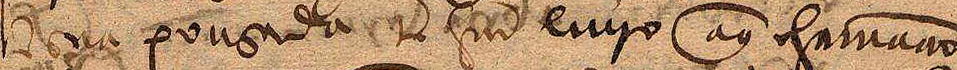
ē sua pousada tē huū liuro a q̄ chamaão
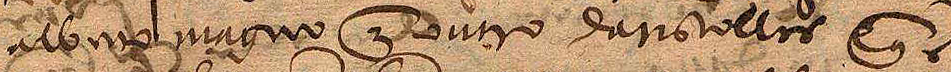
alberto magno item outro daristolles e q̄ ē
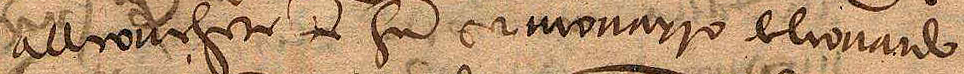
allcouchete tē hū sermonayro de lionardo
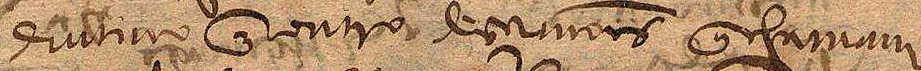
diutino item outro de sermões q̄ chamam
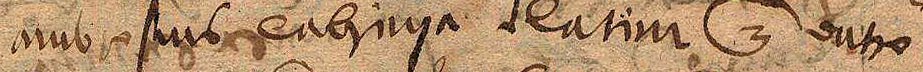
ambrosius e a briuja ē latim item outro
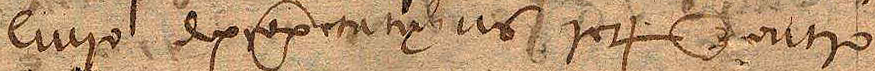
liuro de prop̄etatybus rerum item outro
